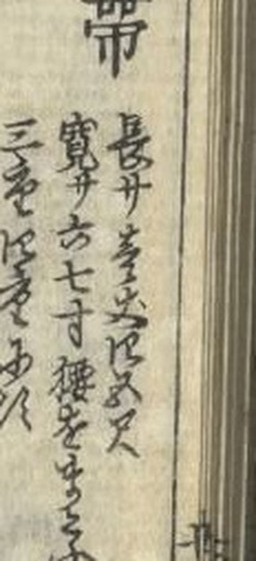帯長サ壱丈四五尺
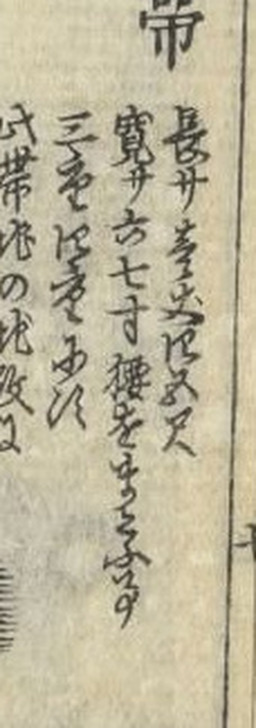寛サ六七寸腰をまとふ事
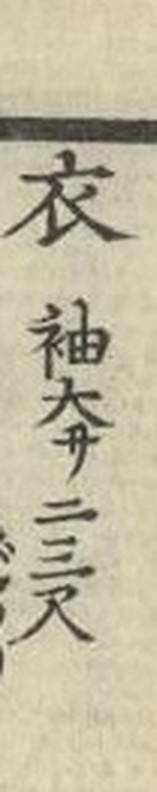衣袖大サ二三尺
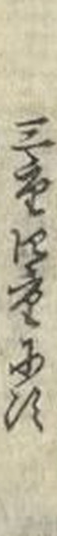三重四重にす
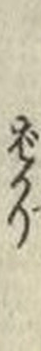ばかり
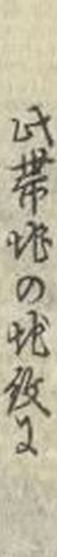此帯地の地紋に
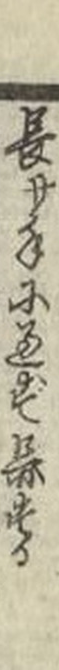長サ手に過ず着する
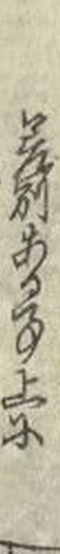差別ある事上に
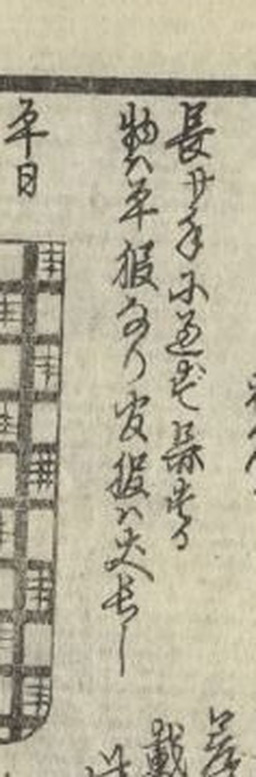物は平服なり官服は丈長し
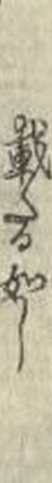載たる如し
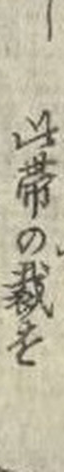此帯の裁を
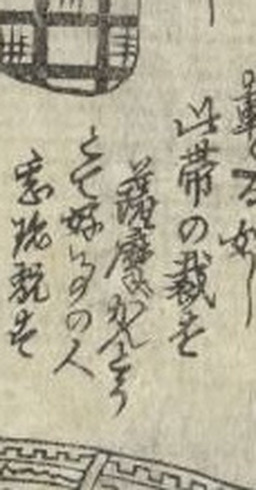薩摩がんとう
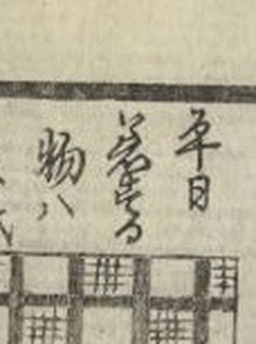着する
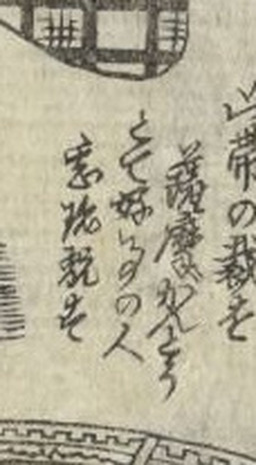とて好事の人
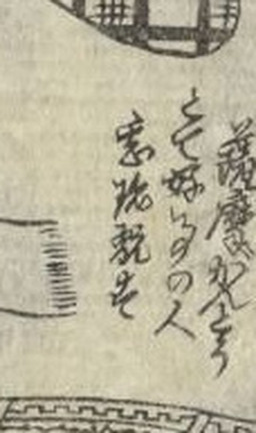甚珍翫す
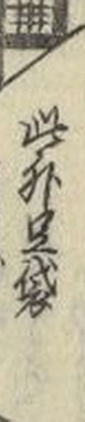此外足袋
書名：琉球解語
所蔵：University of the Ryukyus Library
